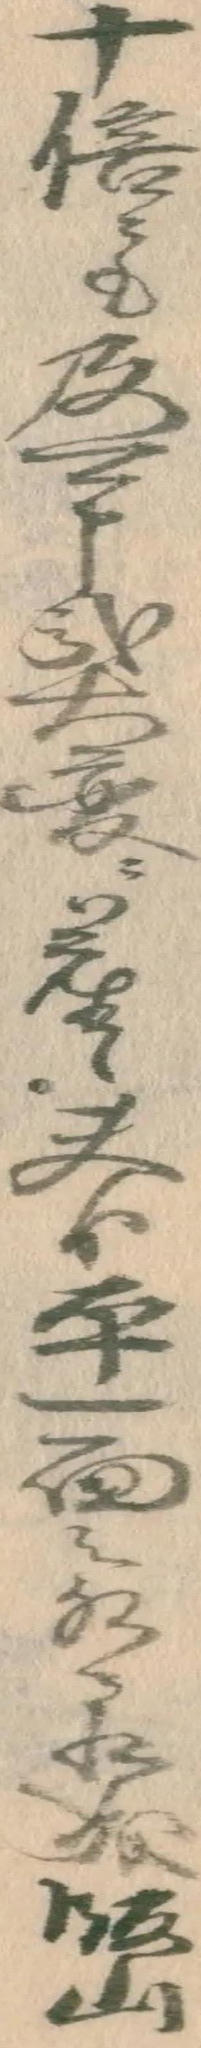十倍二も及可申哉大変二御座候夫ゟ平一面水二相成飯山
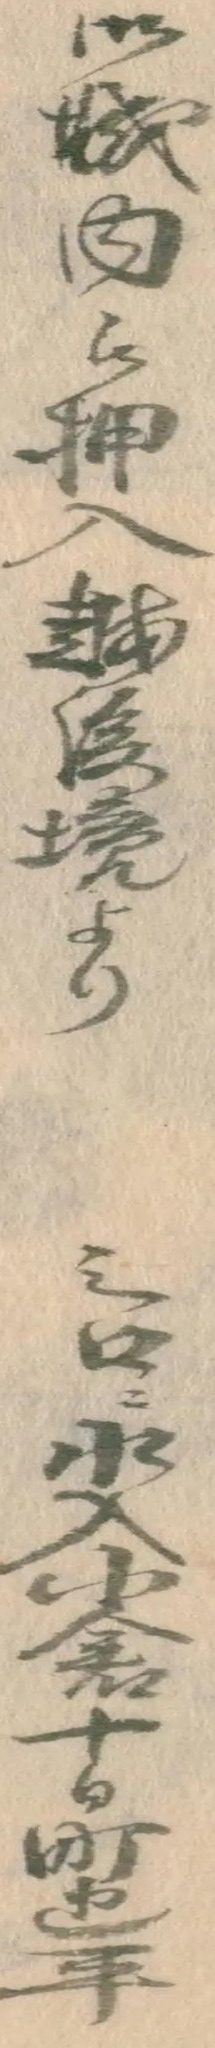御城内江押入越後境より之口二水入小倉十日町辺平
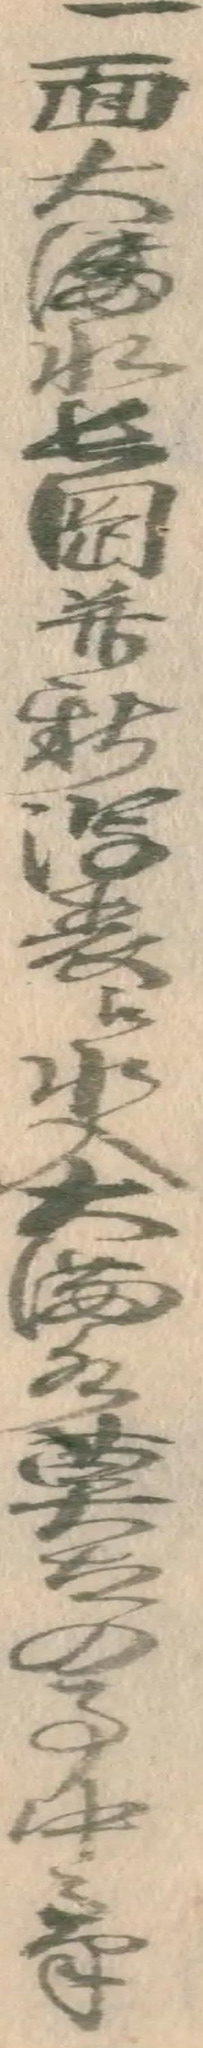一面大満水長岡并新潟表江水入大満水莫大之事中々筆
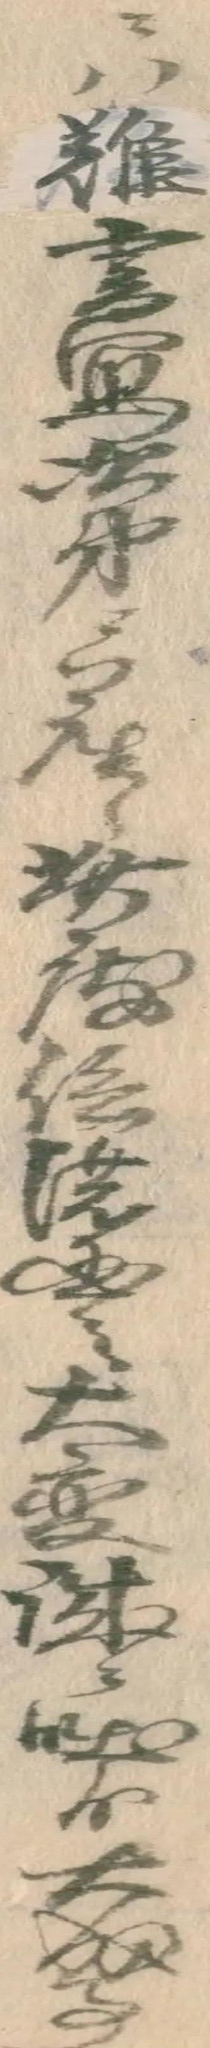二は難書写次第二御座候此処信濃国之大変誠二咄ゟ大成事
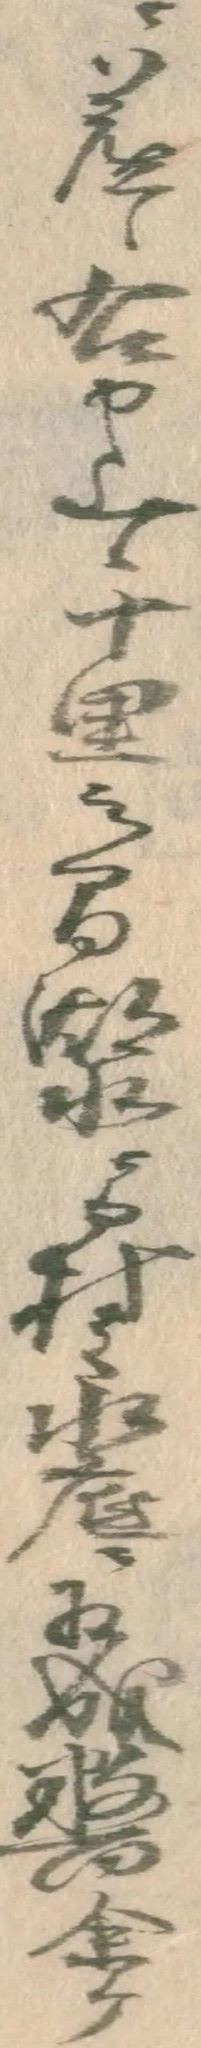二御座候右申上候十里之間湖水二而村々水底二相成数百余ヶ
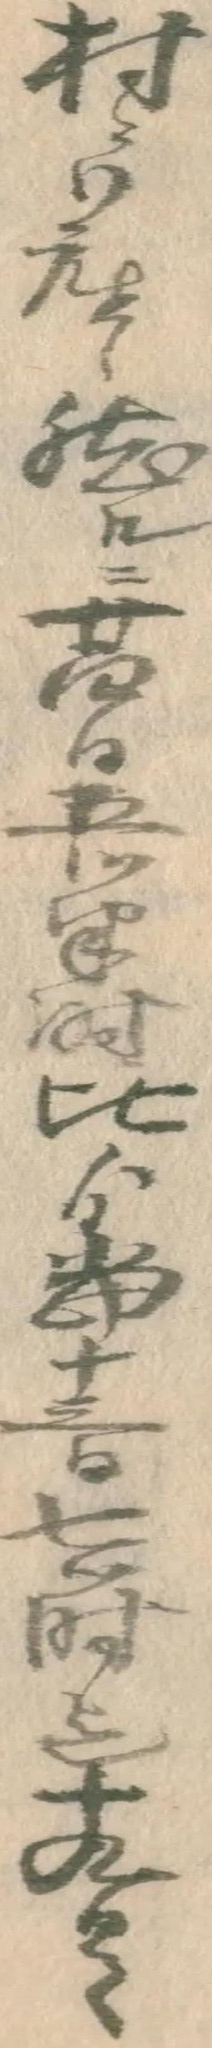村二御座候然ㇽ二廿四日五ッ半時比ゟ当十三日七ッ時迄十九日之
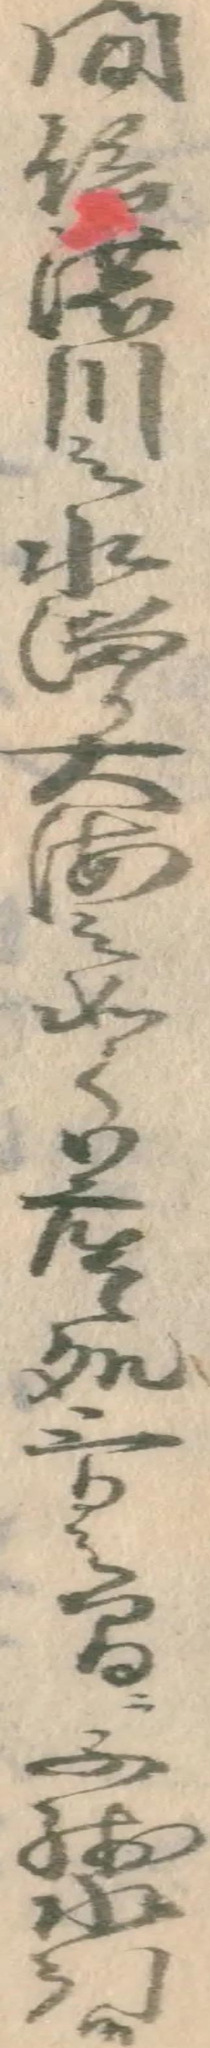間信濃川之水溜り大海之如く御座候処三日の間二不残水引候
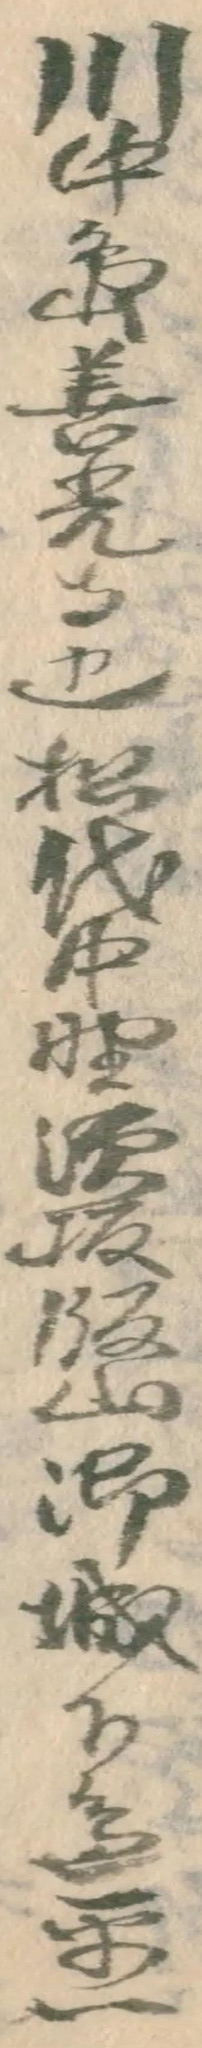川中嶋善光寺辺松代中野須坂飯山御城下辺平一
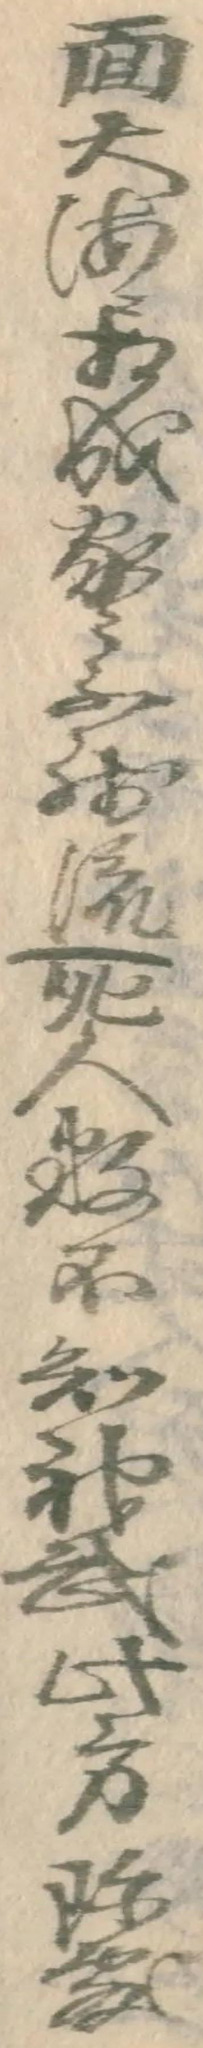面大海二相成家々不残流死人数不知神武此方珍敷

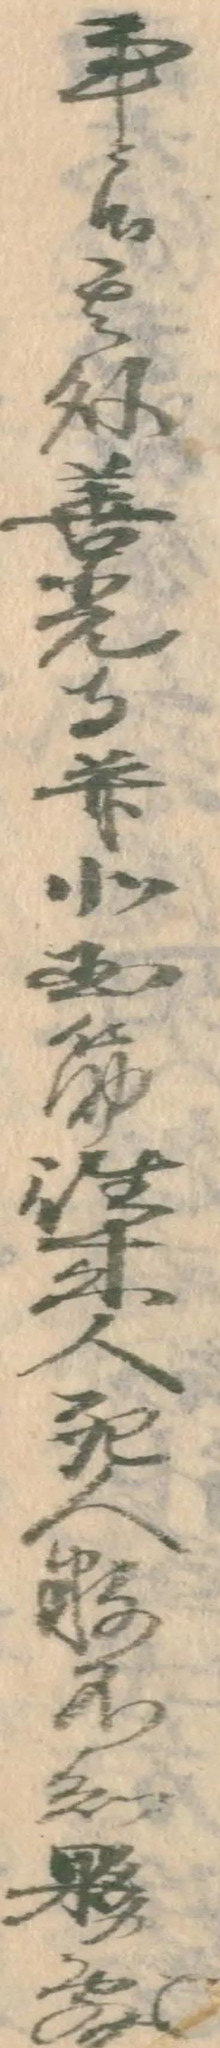事二而其外善光寺并北国筋往来人死人数不知夥敷
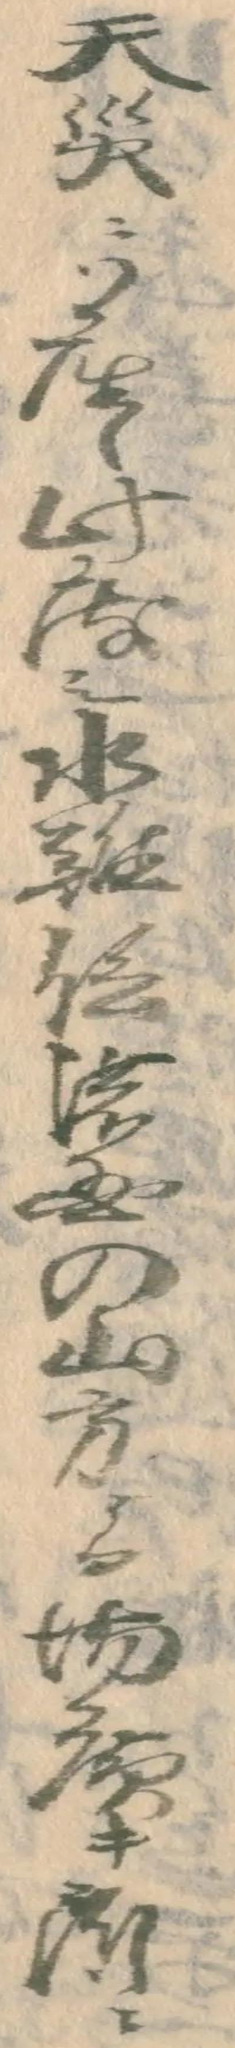天災二御座候此度之水難信濃国之山方二而場広キ所二
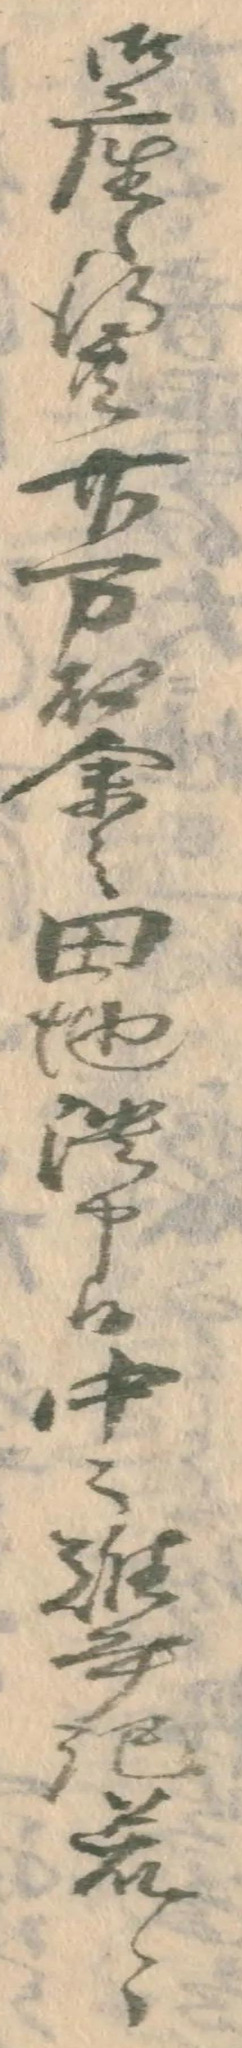御座候得共廿万枚余之田地潰申候中々難書記荒々
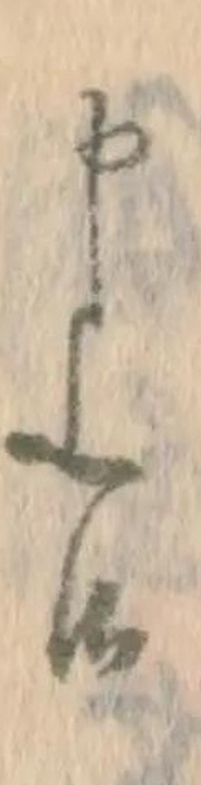申上候

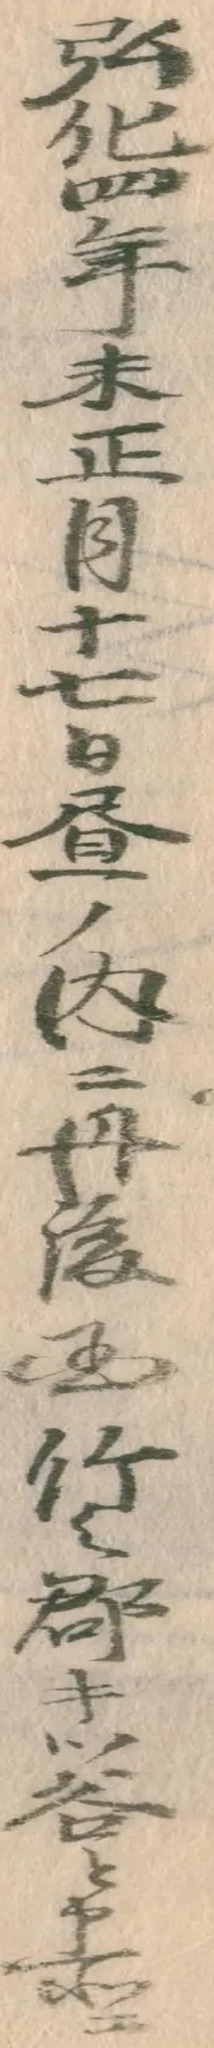弘化四年未正月十七日昼ノ内二丹後国竹之郡キツ谷と申所へ
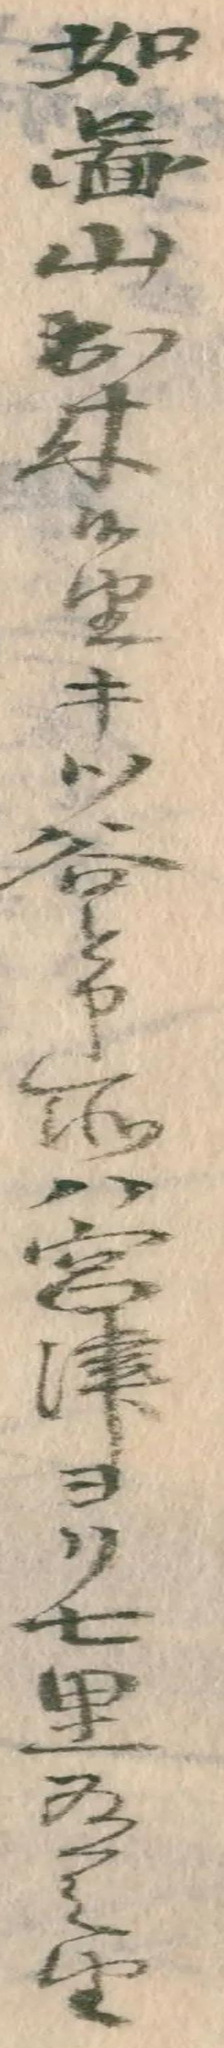如図山出来候由キツ谷ト申所ハ宮津ヨリ七里有之由
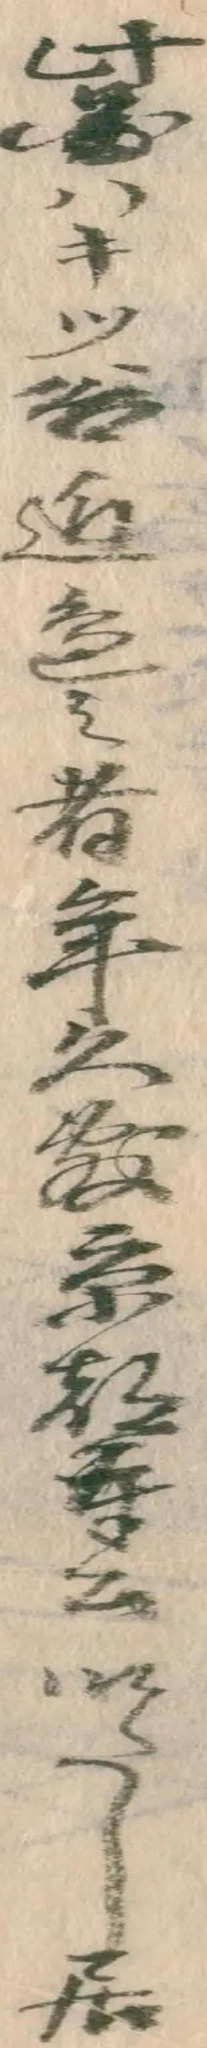此図ハキツ谷近辺之者年久敷京都奉公いたし居
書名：信州大地震之記
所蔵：国立国会図書館 National Diet Library, JAPAN
